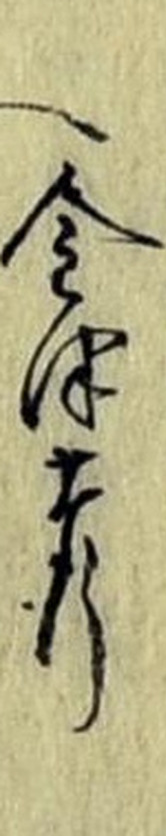金津奉行
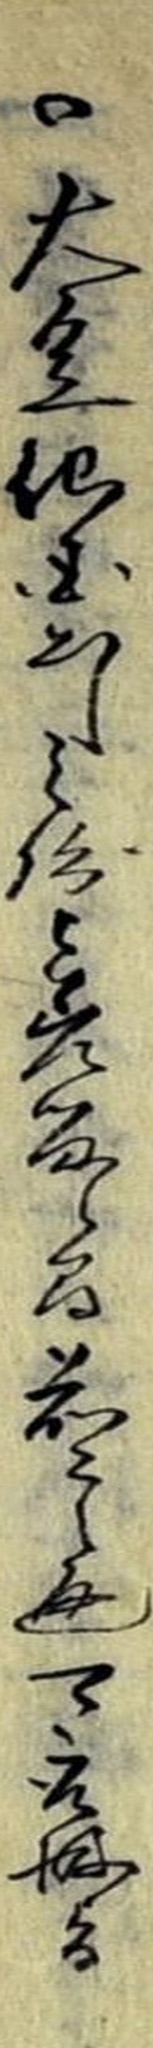○大豆他国出し之儀被差留候間前々之通可取扱旨
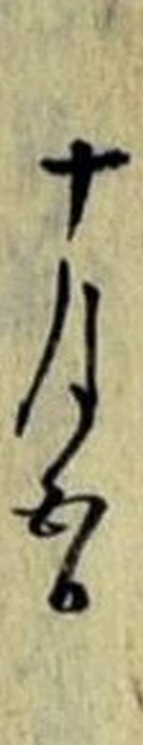十月五日
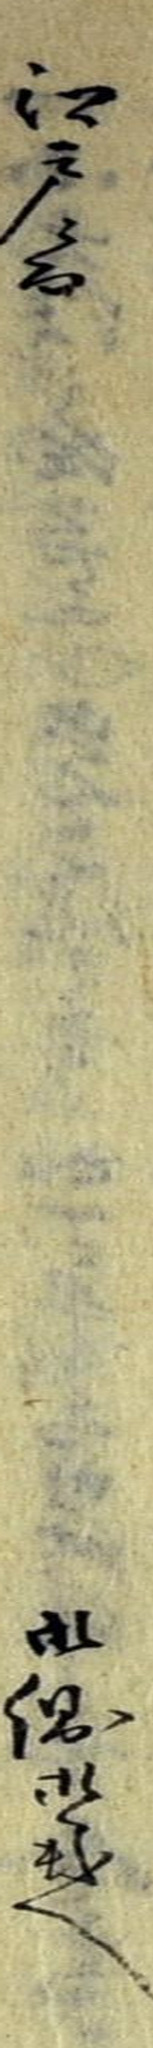江戸に而御側御用人
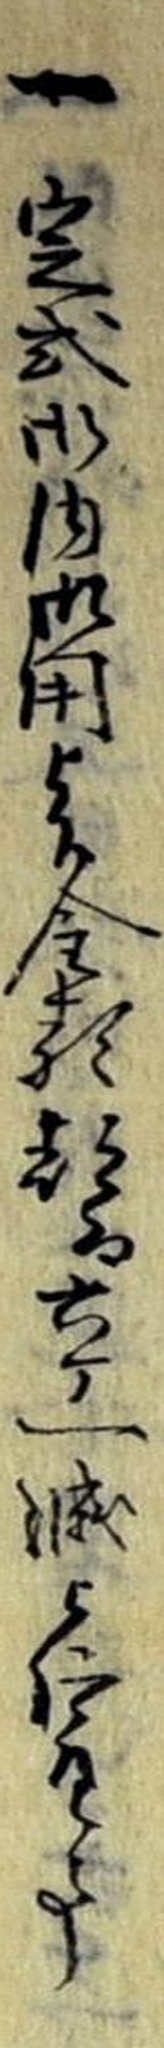○定式御内用被下金都而六ヶ一減被仰付候事

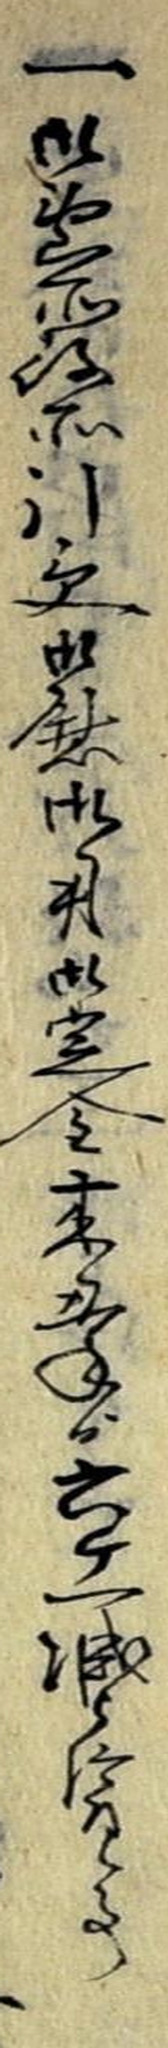一御台所役所引受御熨御用御定金来丑年ゟ六ヶ一減被仰付候事
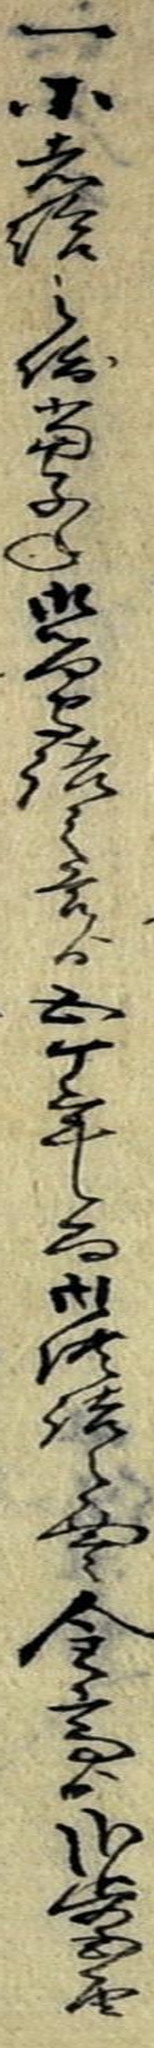一小者給之儀当子年御留守詰之節ゟ五ヶ年之間御供詰之面々金高ゟ弐歩五厘
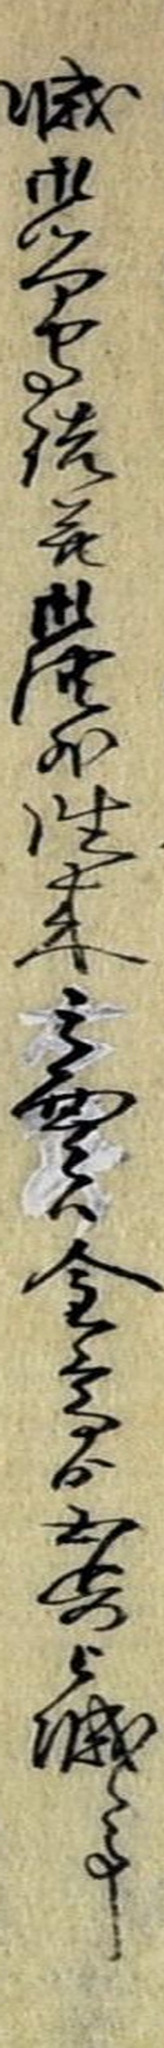減御留守詰并御供外往来之面々は金高ゟ五歩被減候事
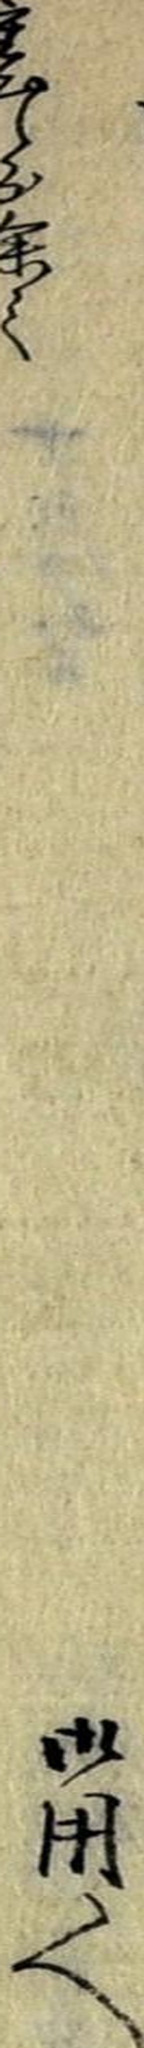重出之分除之御用人
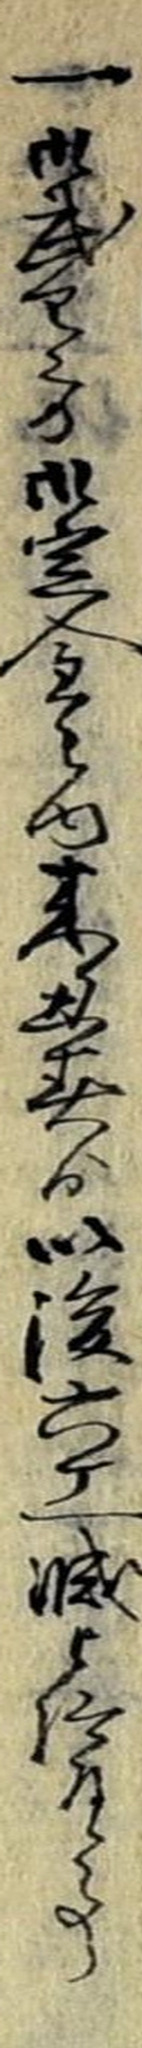一御武具方御定金之内来丑春ゟ以後六ヶ一減被仰付候事
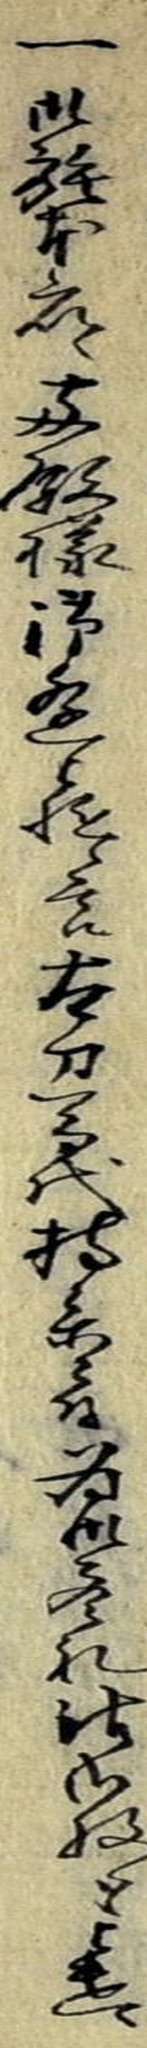一御旗本衆へ両殿様御逢被遊候節太刀馬代持参に付為御答礼銀弐枚つヽ被遣候
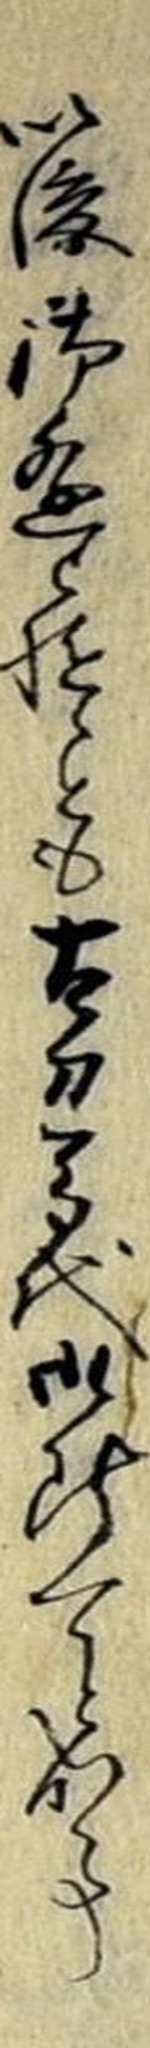以後御逢被遊候とも太刀馬代御断可被成事
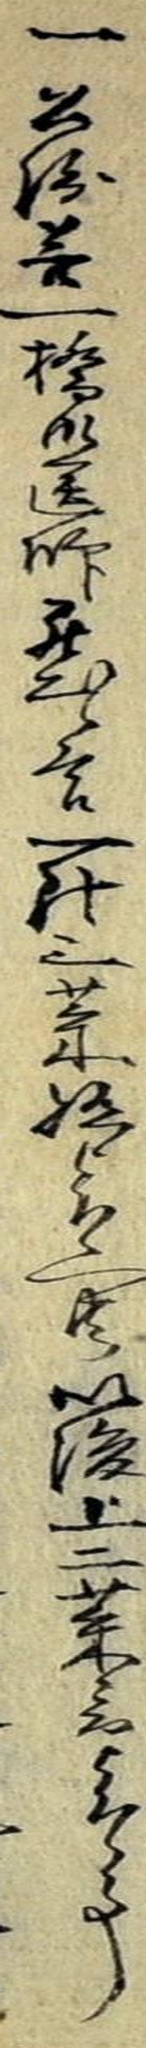一公儀并一橋御医師罷出候節一汁三菜賄被下候へ共以後上二菜に而被下候事
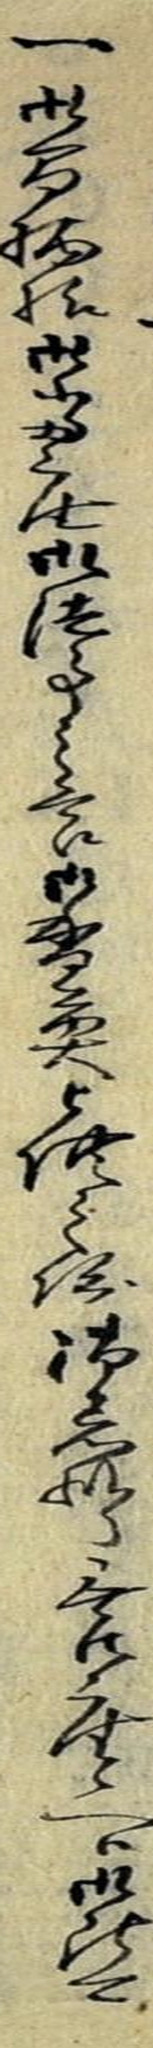一御間柄様御当座御法事之節御香典被供候之儀御忌掛り無御座候へは御断可
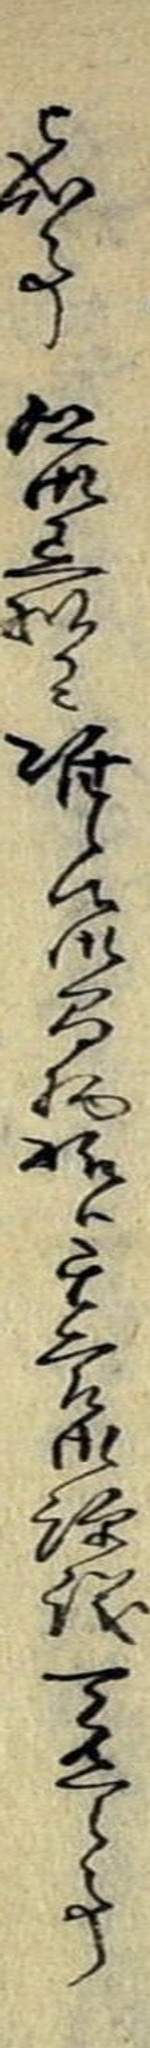被成事但御忌掛りに准し候御間柄様は其節御評議可有之事
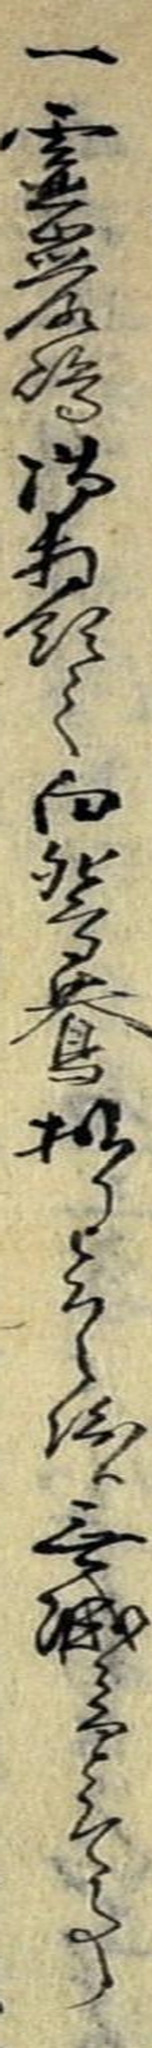一霊厳嶋御拝領之白鴛鴦掛り被下候儀は無減に而被下候事
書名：命令之部 四
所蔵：福井県文書館 Fukui Prefectural Archives
